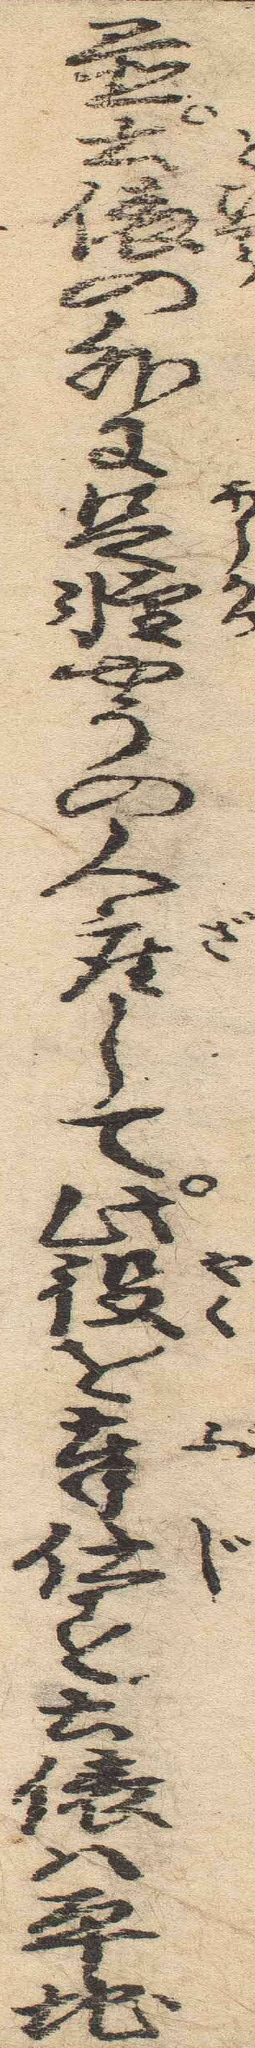置。土俵の外に足軽やうの人座して。代役を奉仕す。土俵は平地
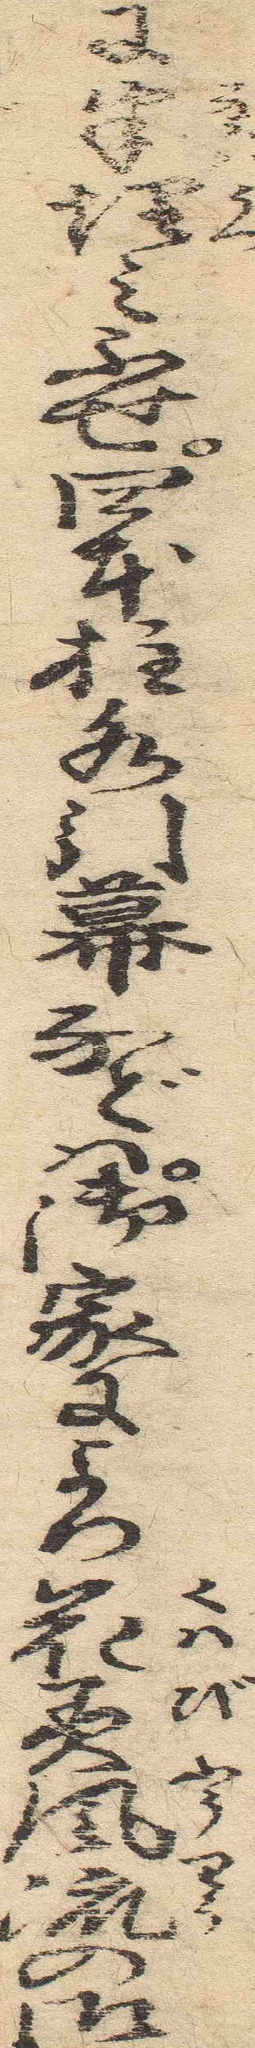に半埋みふせ。四本柱水引幕などは。御家により花美風流の御
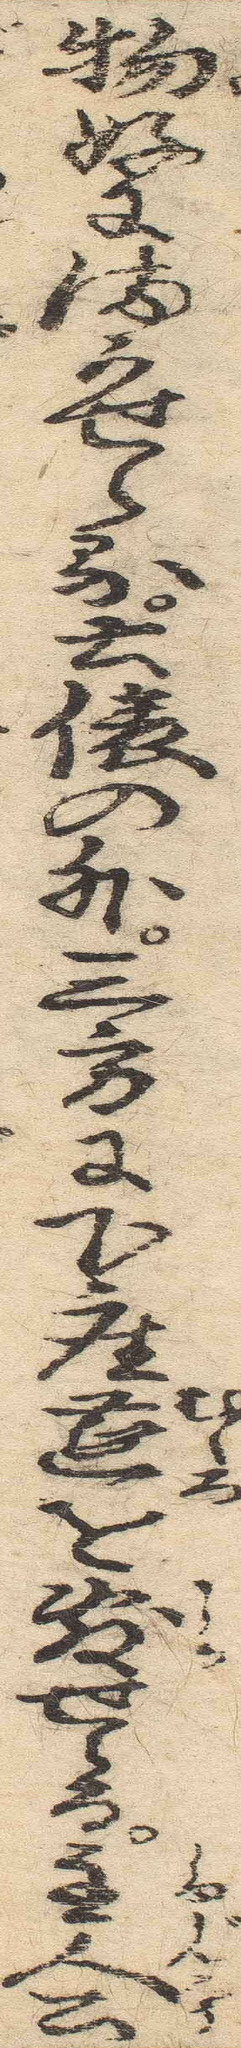物好にまかせらる。土俵の外。三方に下座筵を敷せらる。主人云
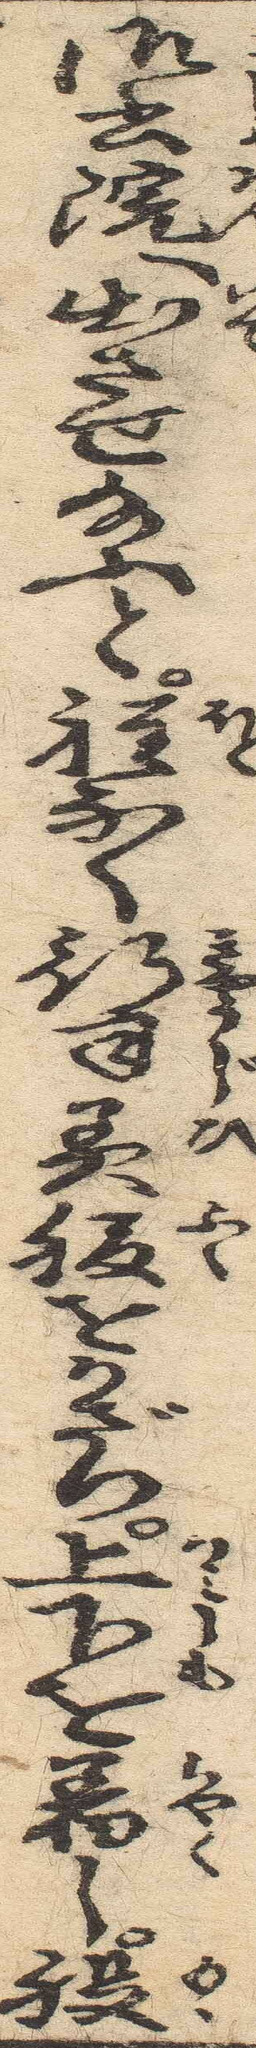御書院へ出させ給ふと。程なく行司美服をかざり。上下を着し。股
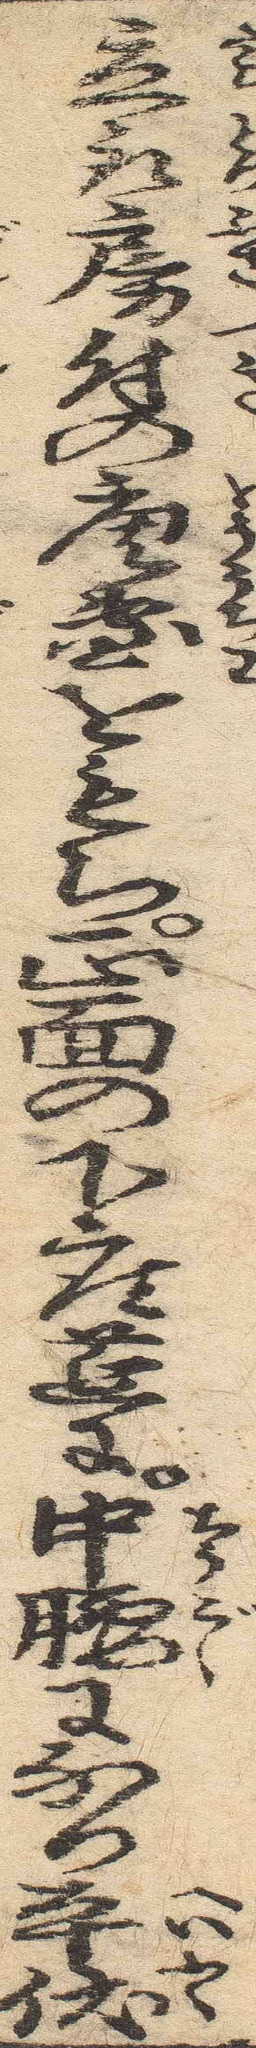立取房付の唐団をもち。正面の下座筵に。中腰になり平伏
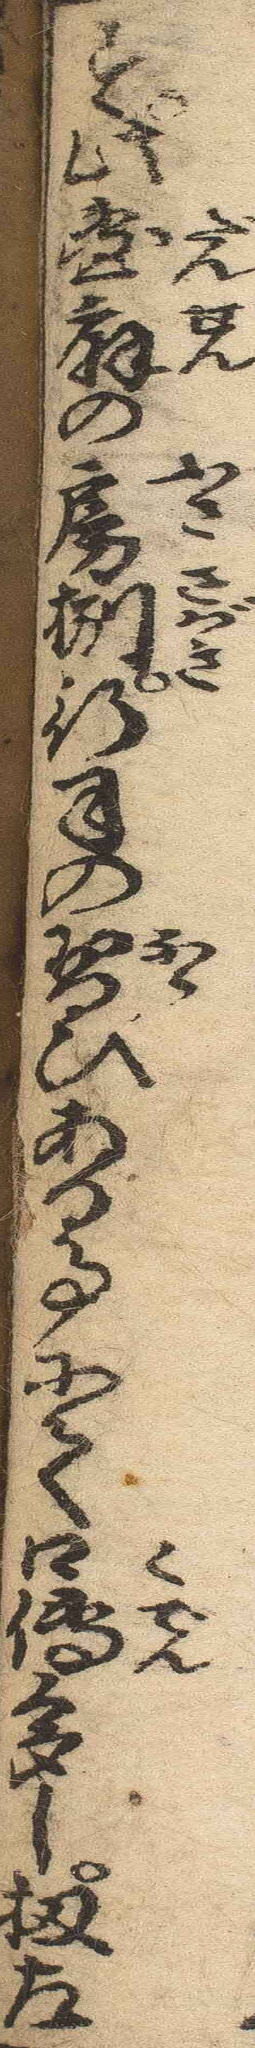す。此団扇の房捌。行司の習ひある事にて口伝多し。扨左
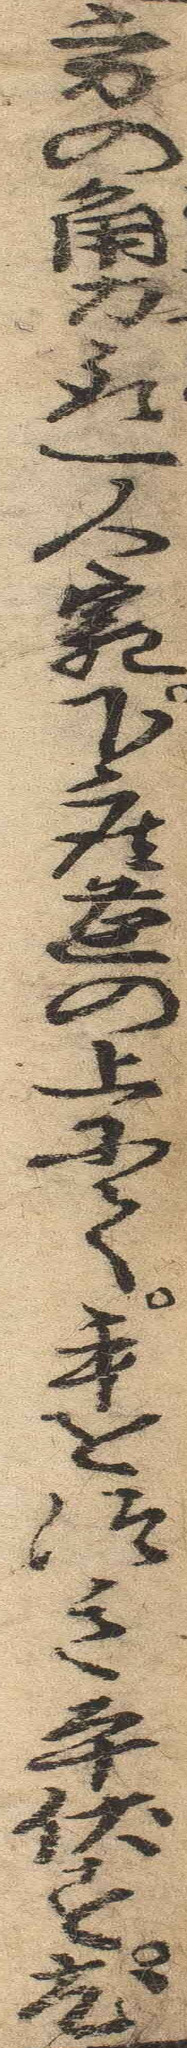方の角力取一人宛。下座筵の上にて。手をつき平伏す。尤
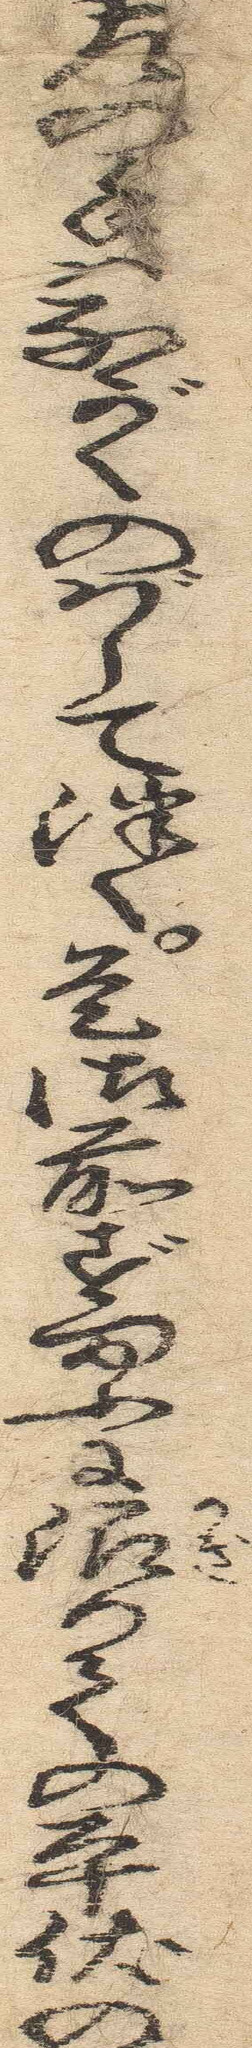左の手はながくのばして深く。是御前ずまうに限りての平伏の
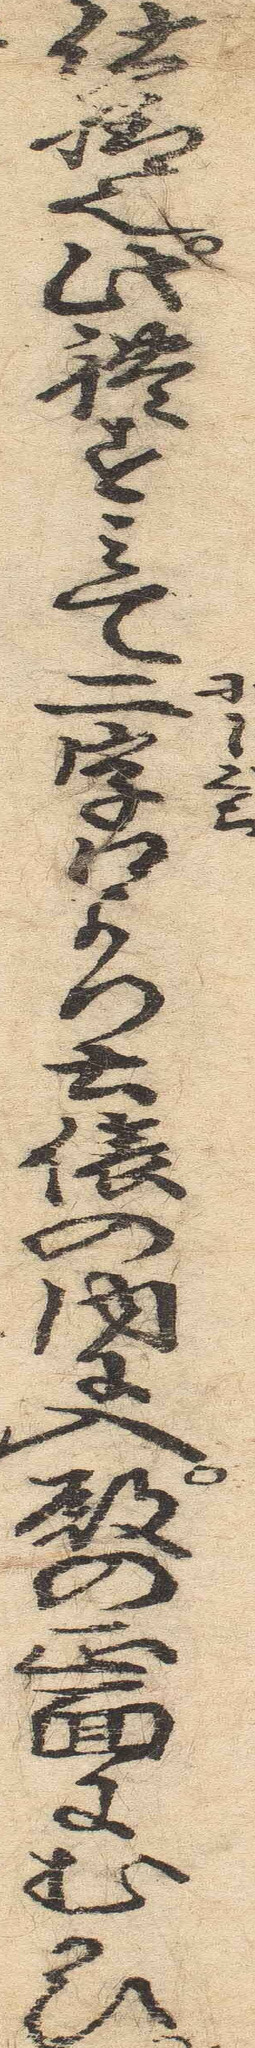仕様也。此禮すみて二字口より土俵の内に入。殿の正面にむかひ。
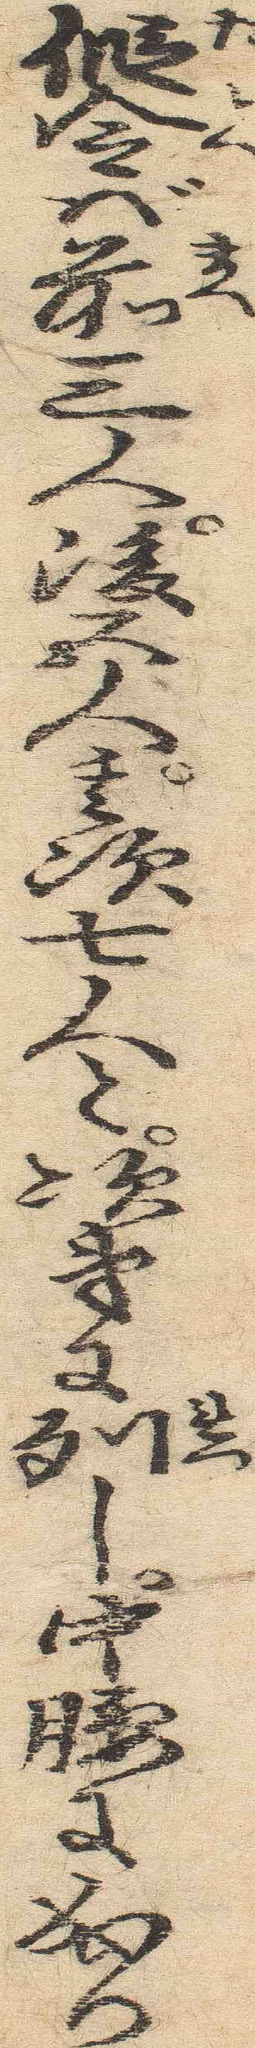仮令ば前三人。後五人。其次七人と。次第に列し。中腰に成り
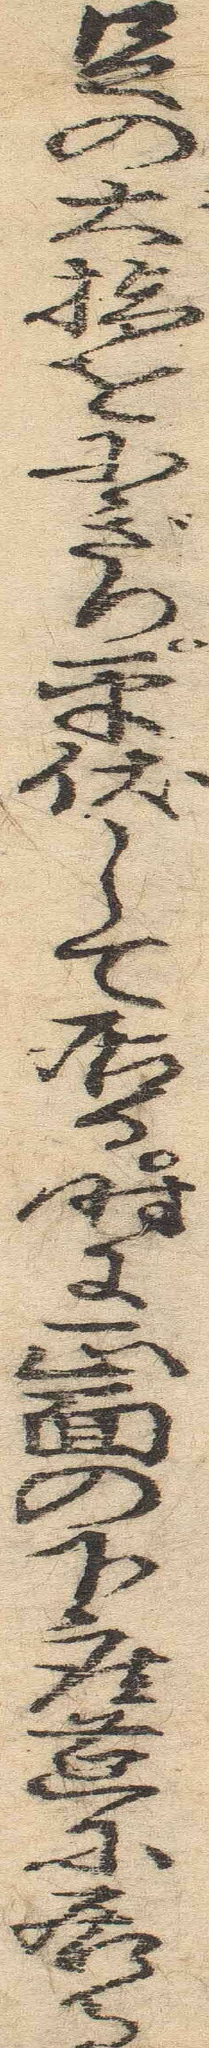足の大指をにぎり。平伏して居る。時に正面の下座筵に居る
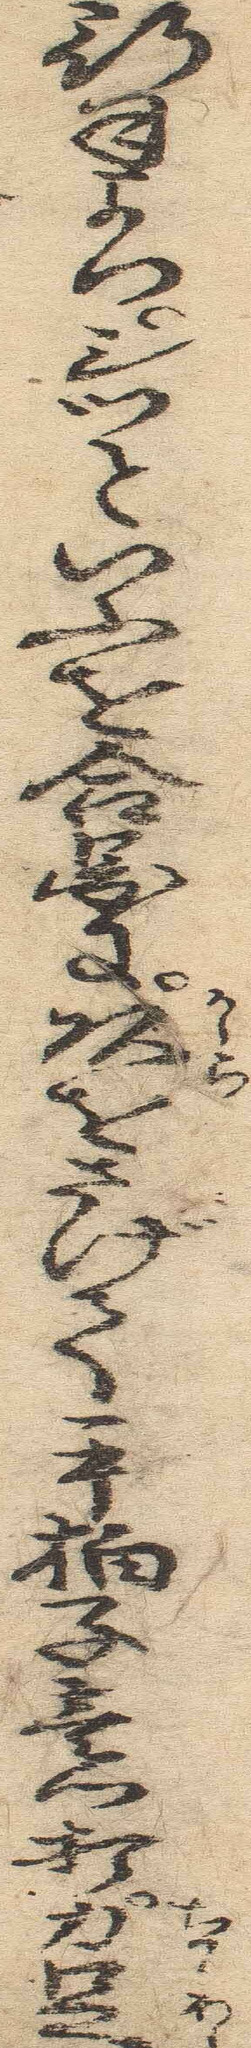行司より。シツといふを合図に。頭をさげて手拍子壱つ打。力足
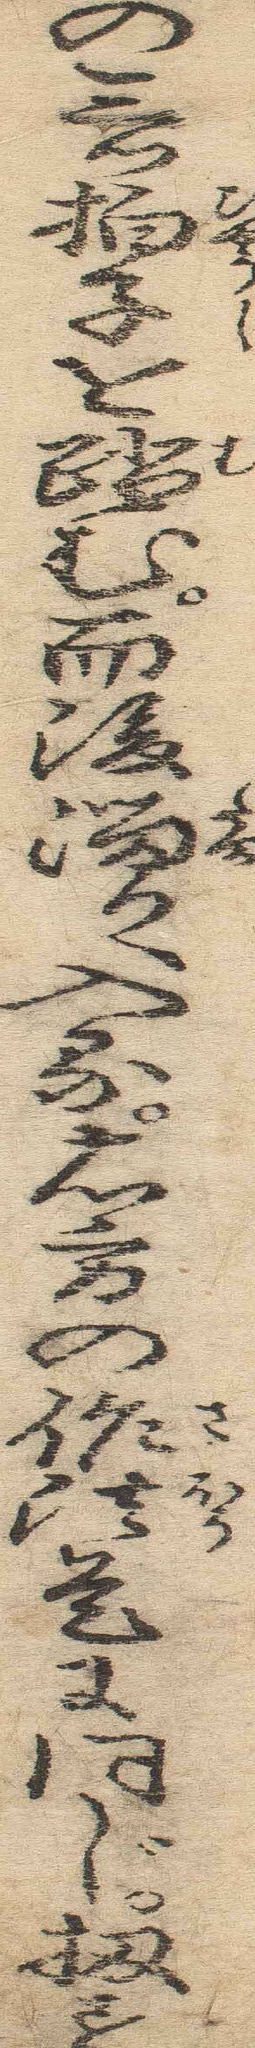の三つ拍子を踏む。而後溜りへ入る。右方の作法是に同じ。扨す
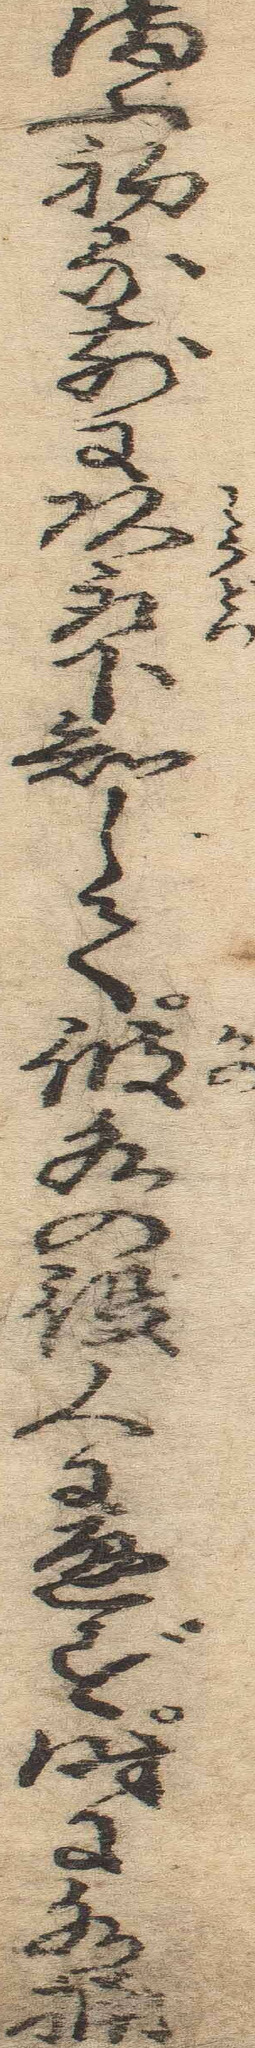まふ初る前に頭取下知して。彼水の役人に通ず。時に水桶
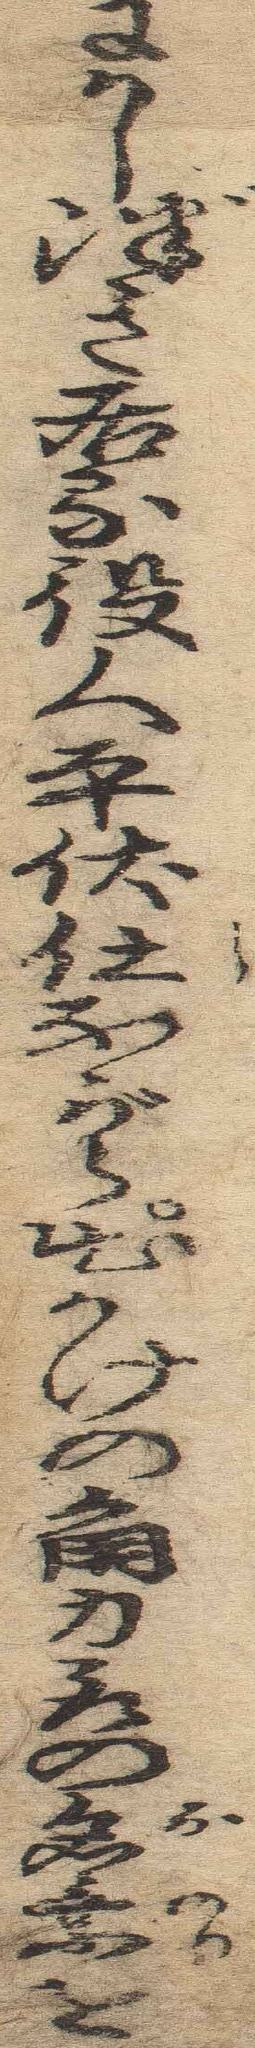にかしづき居る役人平伏仕ながら。出かけの角力取の名乗を

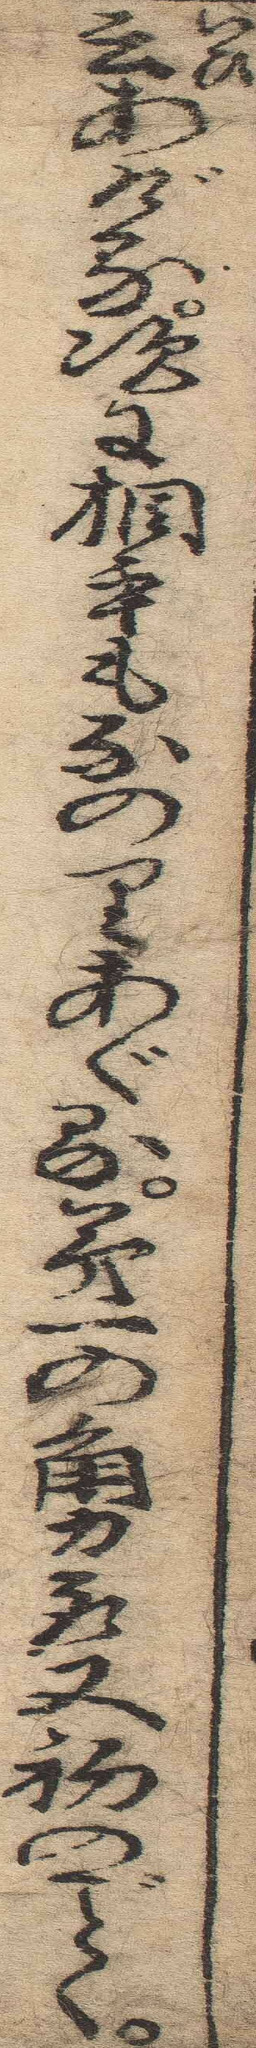云あげる。次に相手もなのりあぐる。第一の角力取又初のごとく。
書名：古今相撲大全
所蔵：東京学芸大学附属図書館 国文学研究資料館
